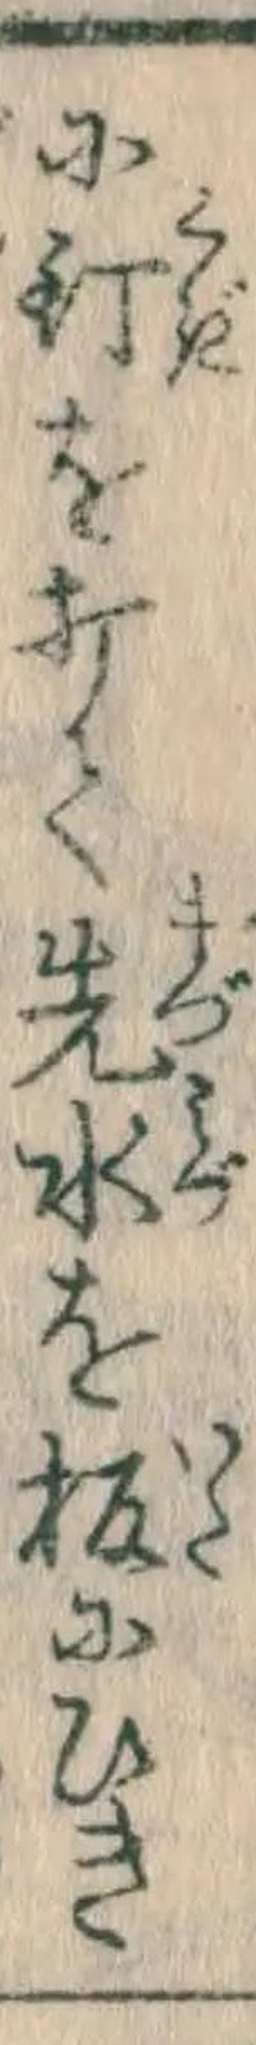に釘を打て先水を板にひき
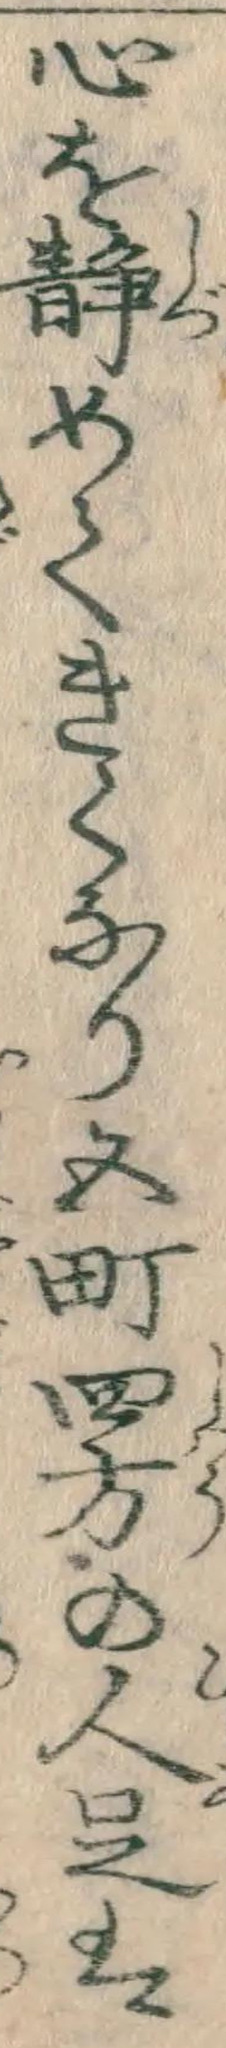心を静めてきくなり五町四方の人足は
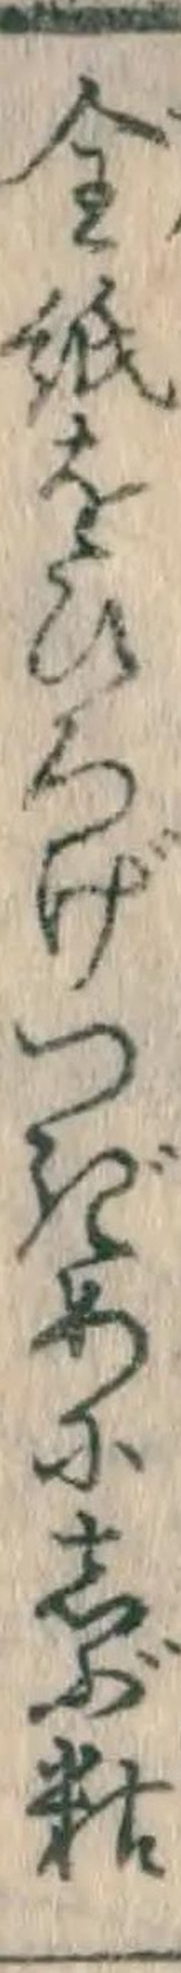全紙をひろげつぎめにしぶ粘
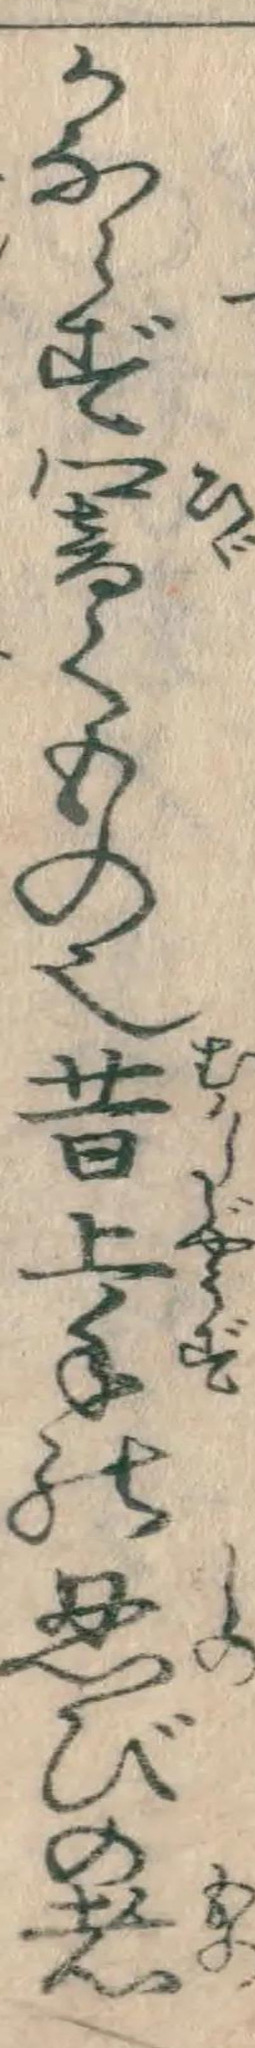かならず響くもの也昔上手の忍びの者
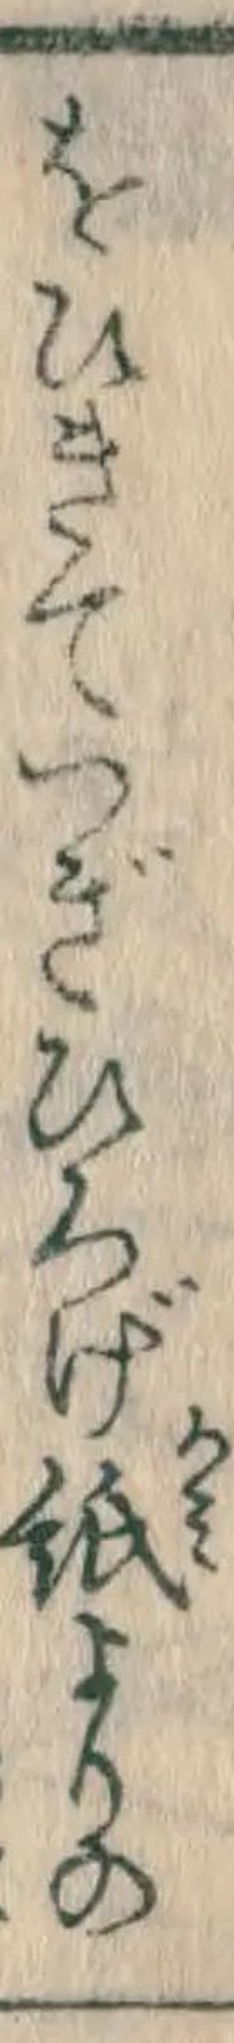をひきてつぎひろげ紙よりの
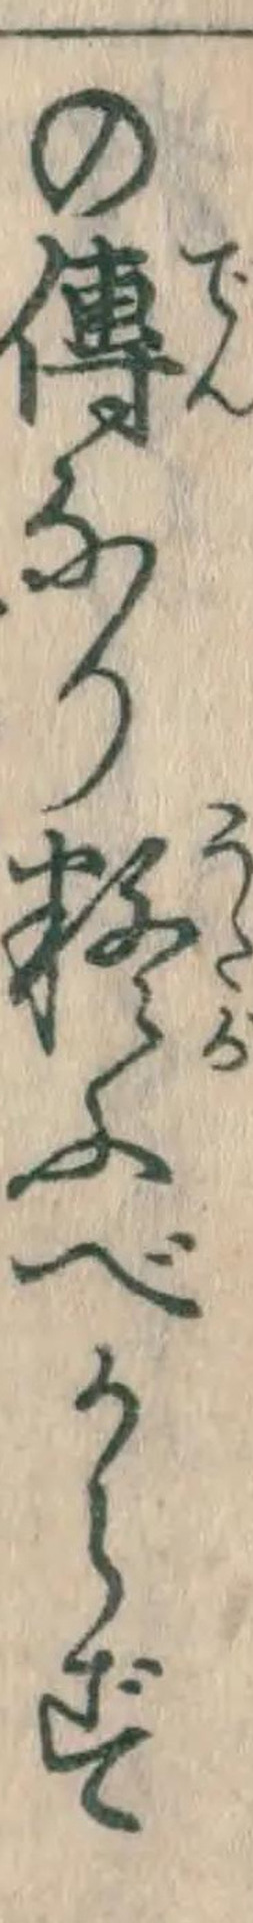の伝なり疑ふべからず
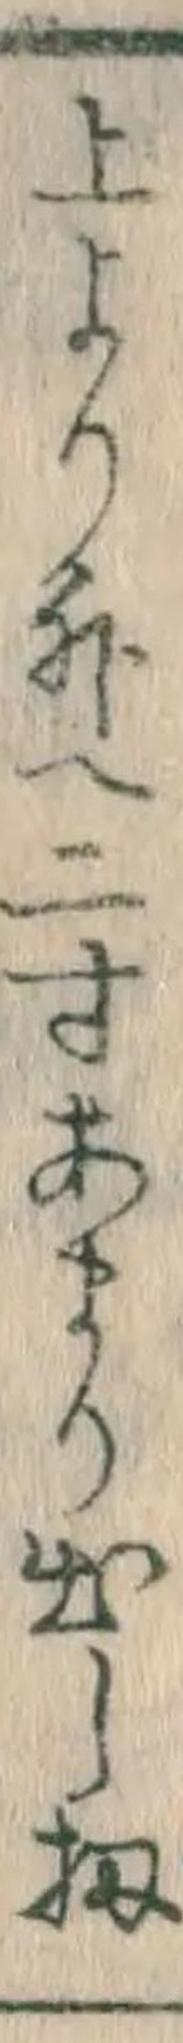上より外へ二寸あまり出し扨
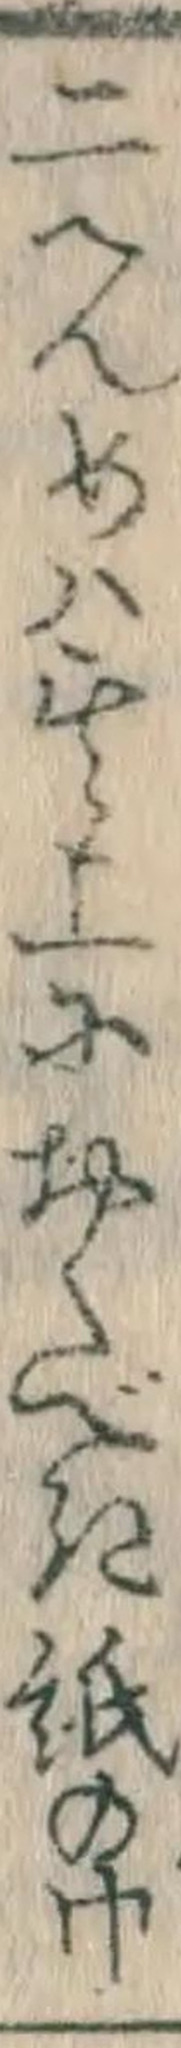二へんめは其上におくべき紙の巾
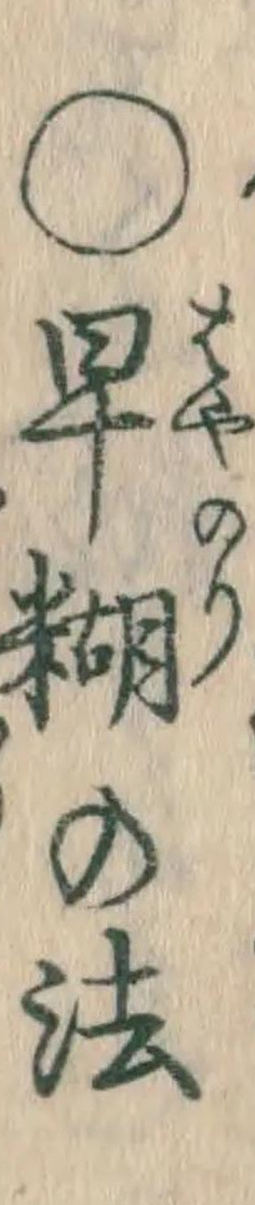○早糊の法
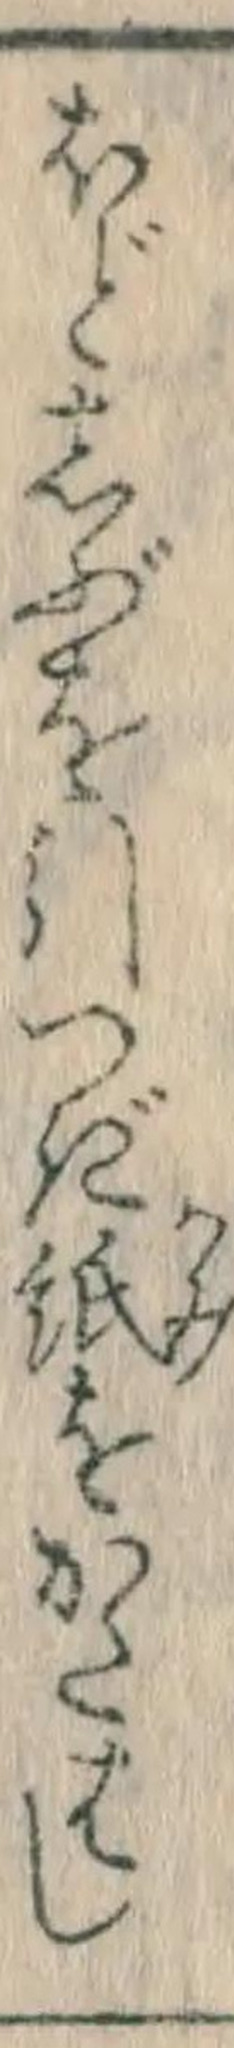ほどしぶを引つぎ紙をかたはし

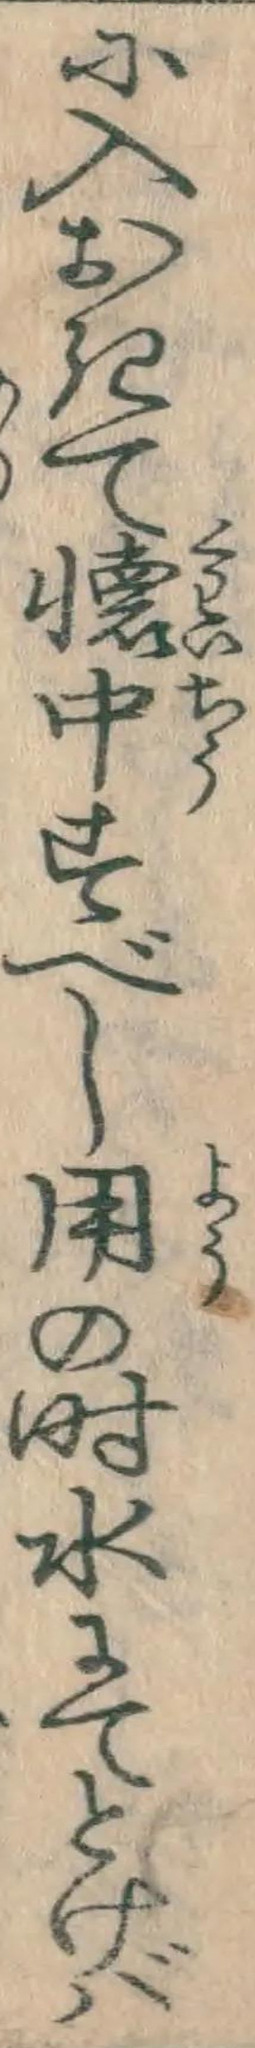に入おきて懐中すべし用の時水にてとけば
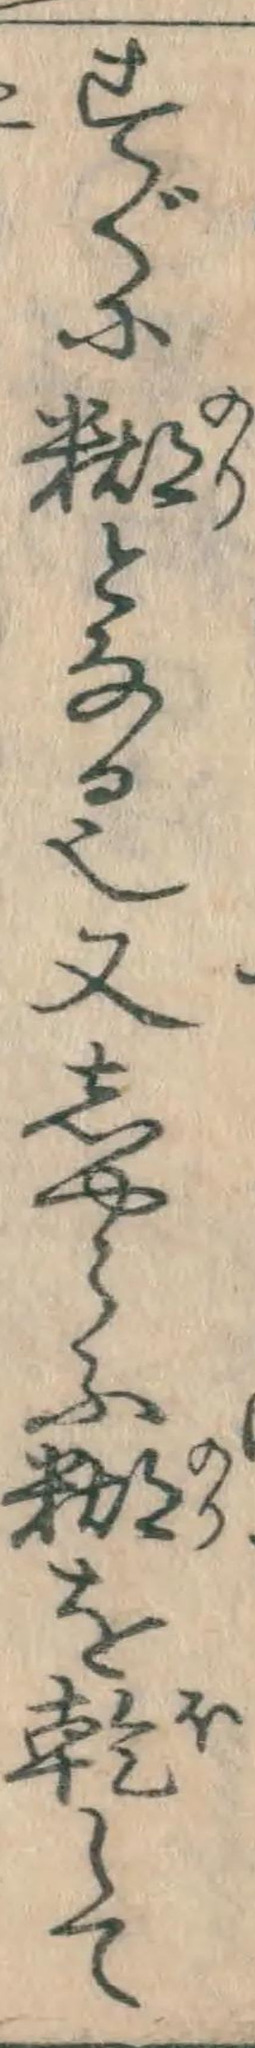すぐに糊となる也又しやうふ糊を乾して
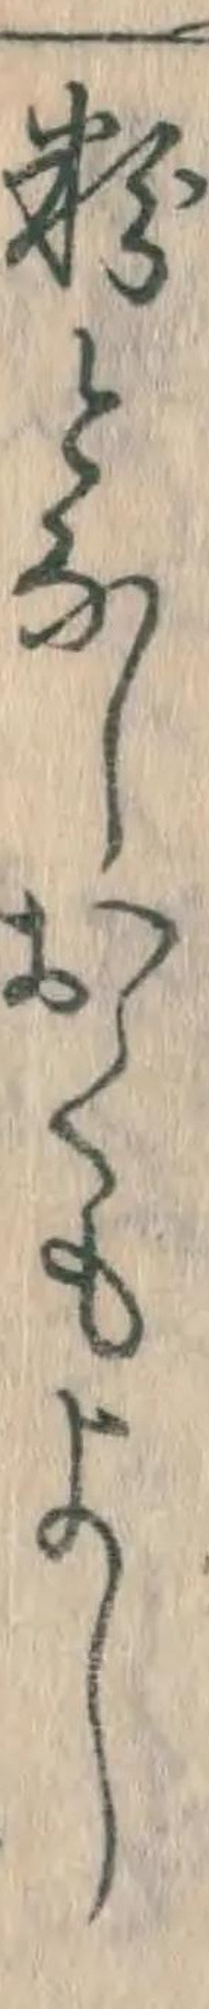粉となしおくもよし
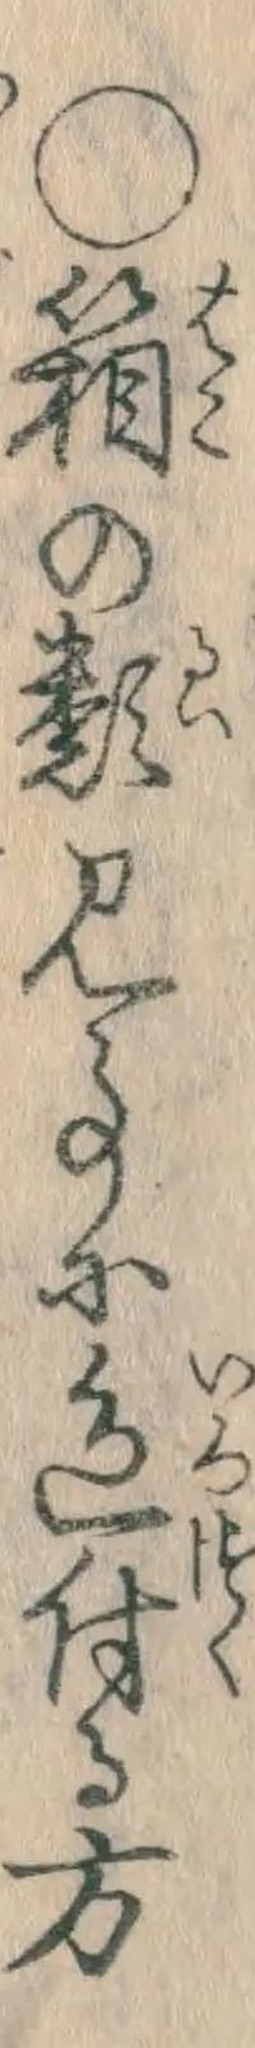○箱の類見事に色付る方
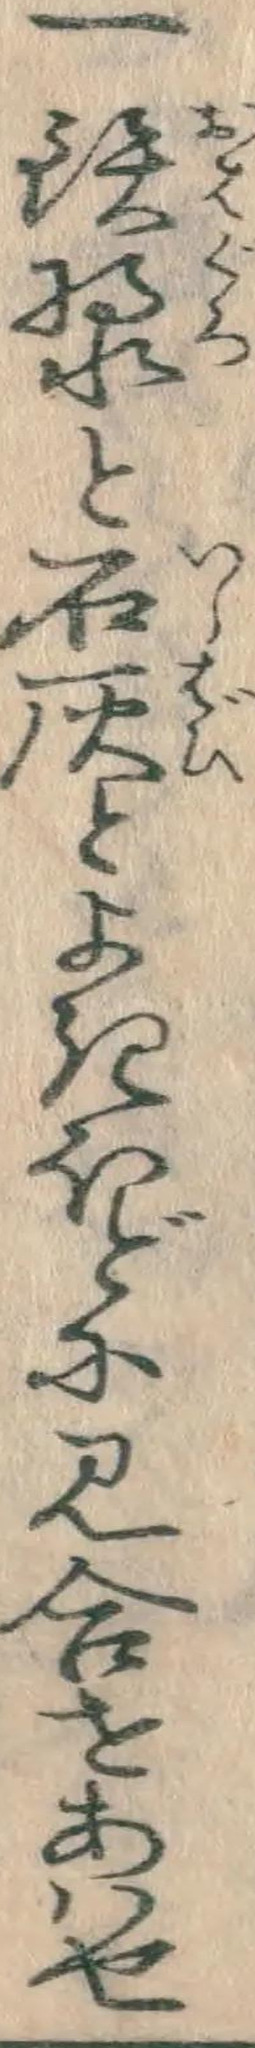一鉄漿と石灰とよきほどに見合せあはせ
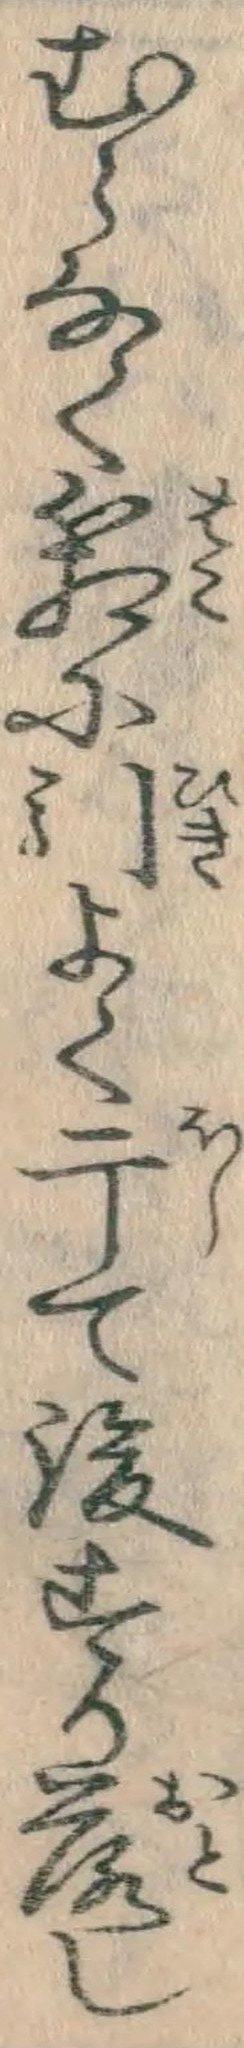むらなく箱に引よく干て後すり落し
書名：広益秘事大全 3巻. [2]
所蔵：国立国会図書館 National Diet Library, JAPAN
